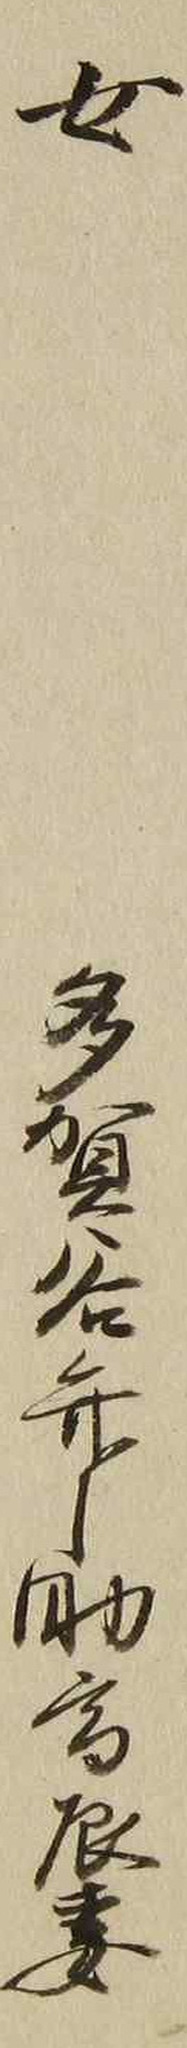女多賀谷弁之助高辰妻
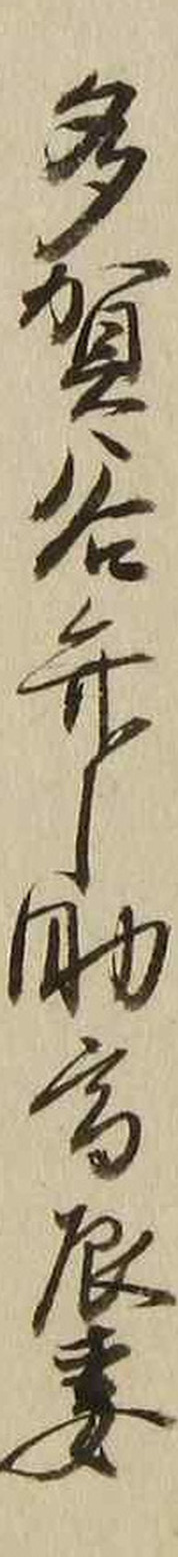女多賀谷弁之助高辰妻
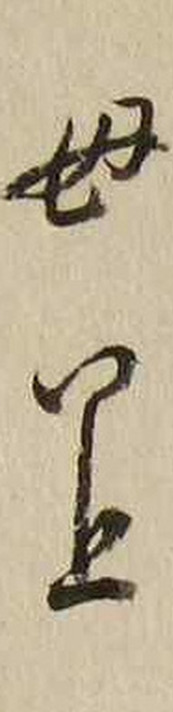母同上

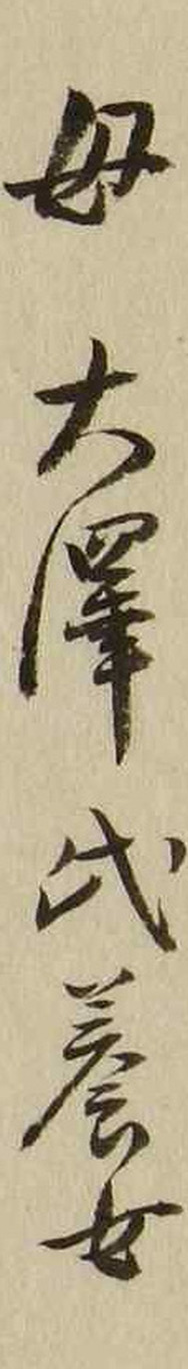母大沢氏養女
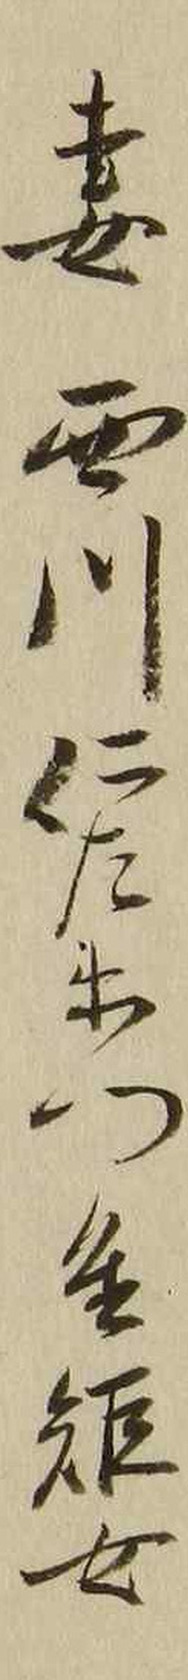妻西川仁左衛門重矩女
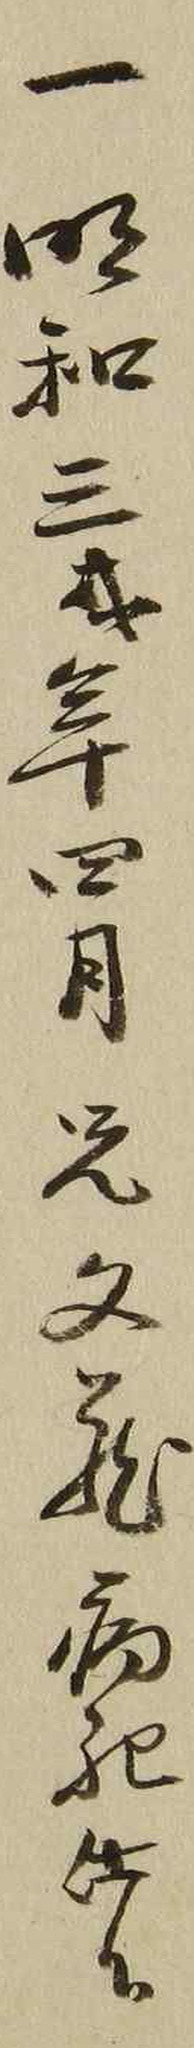一明和三戌年四月兄文蔵病死仕候
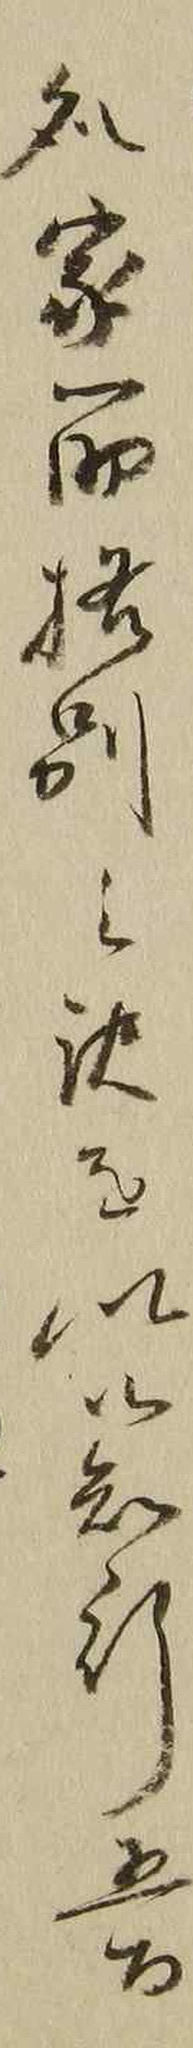処家筋格別之訳を以御知行五百
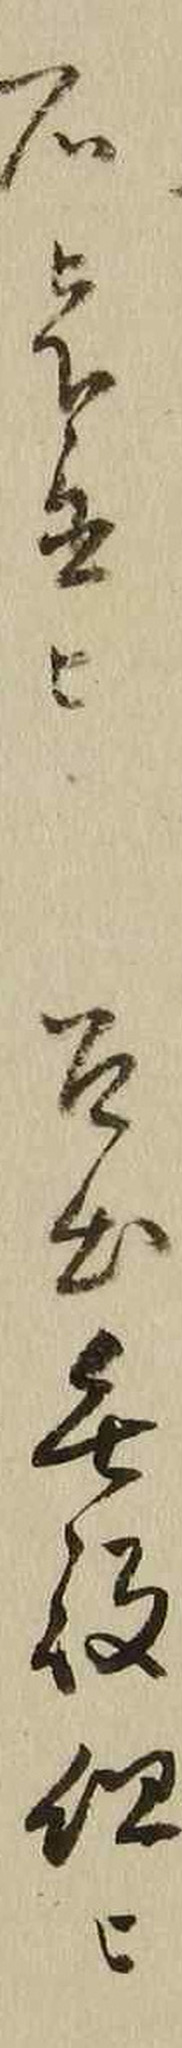石被下置被召出無役組被
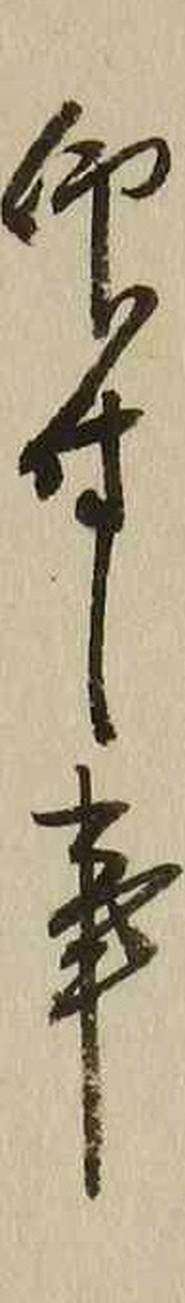仰付候事
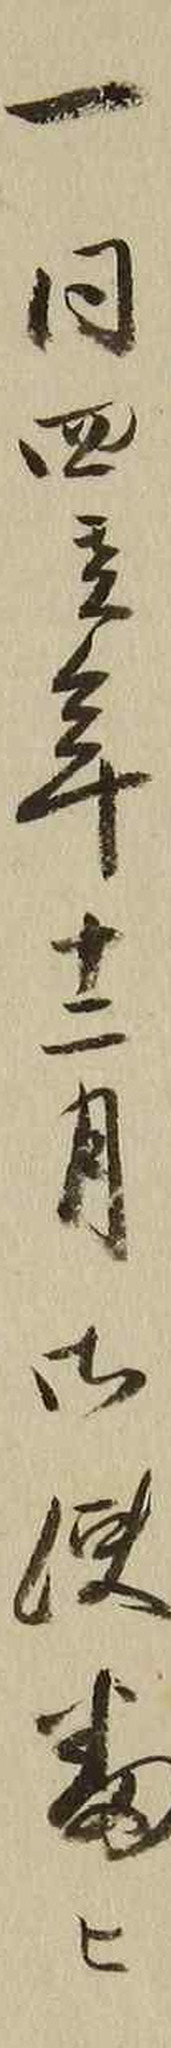一同四亥年十二月御使番被
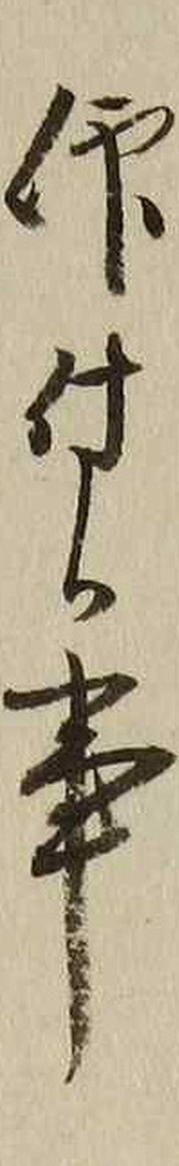仰付候事
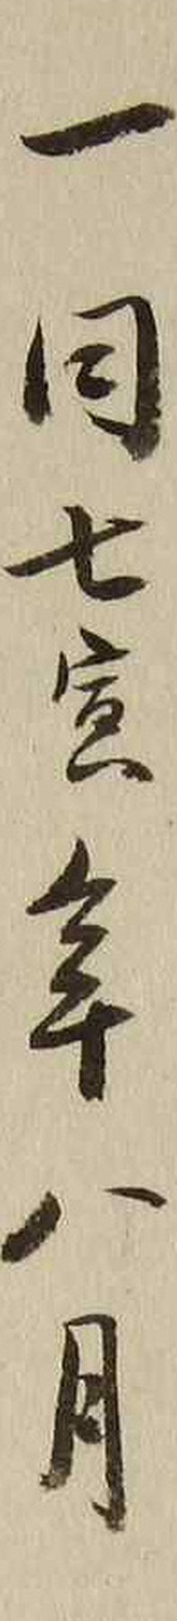一同七寅年八月
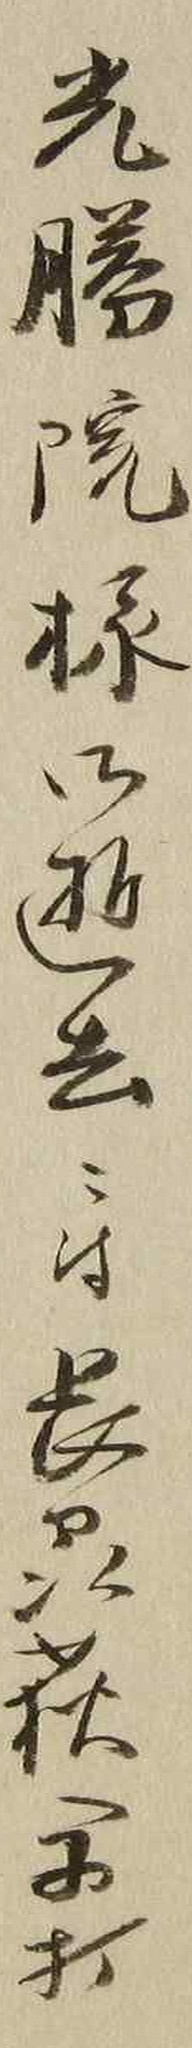光勝院様御逝去に付長州萩へ早打
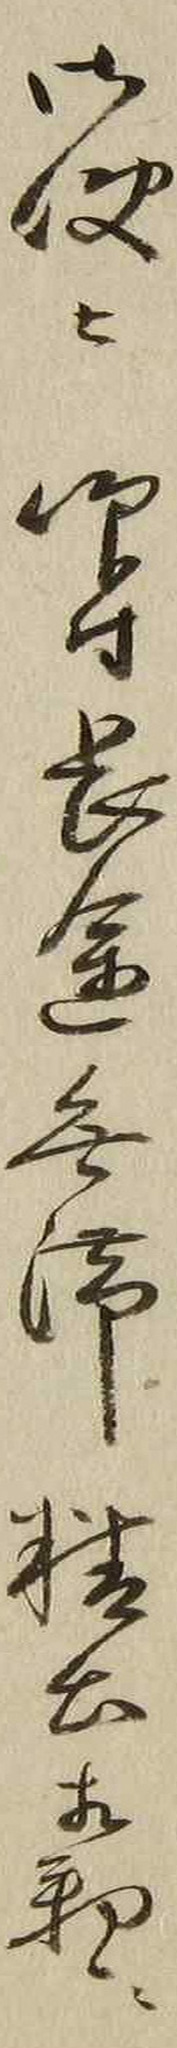御使被仰付長途無滞精出相勤候
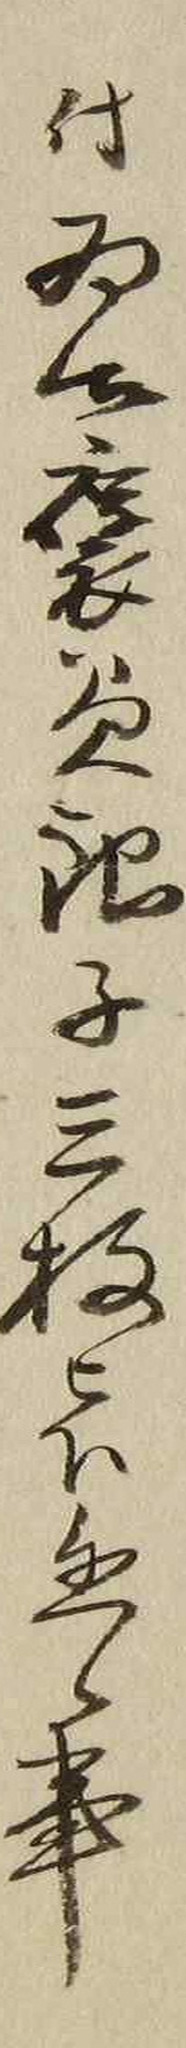付為御褒美銀子三枚被下置候事
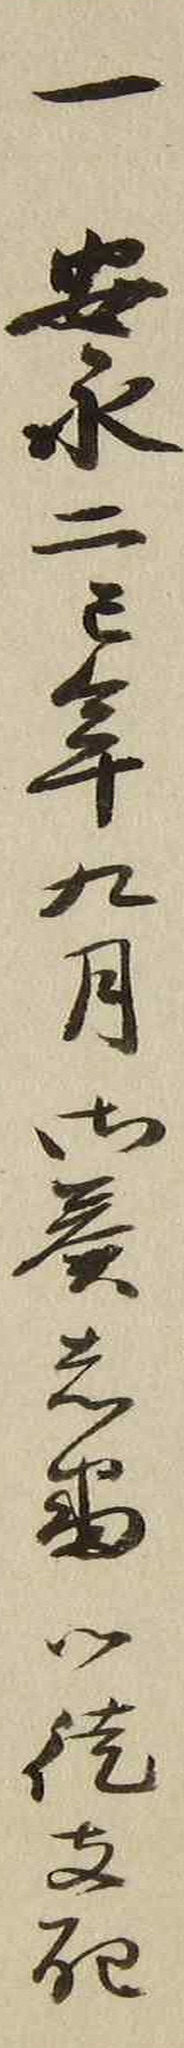一安永二巳年九月御奏者番御徒支配
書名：諸士系譜　巻之269　さ之部1
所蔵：会津若松市立会津図書館
